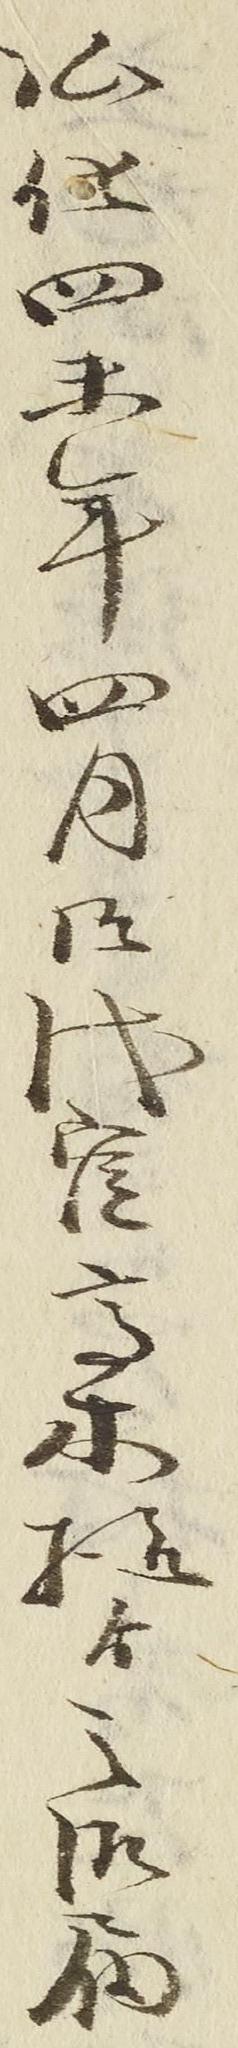弘化四未年四月御代官高木様ゟ之御届
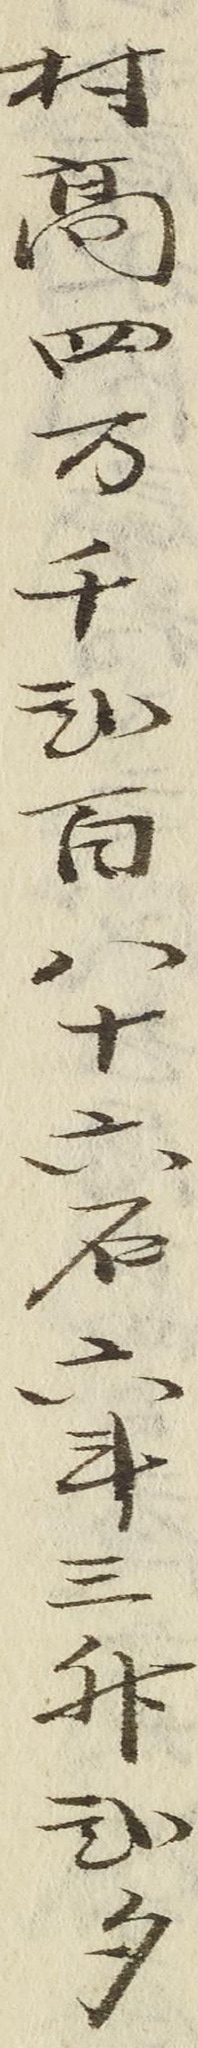村高四万千弐百八十六石六斗三升弐夕
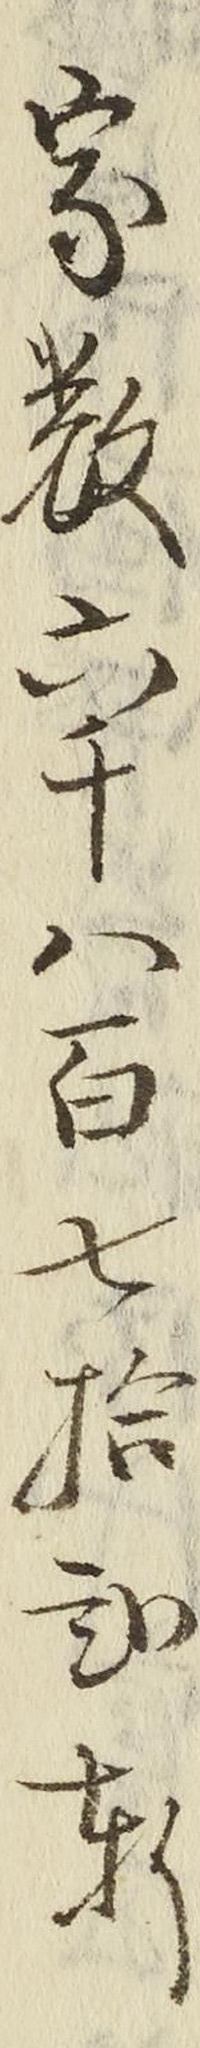家数六千八百七拾弐軒
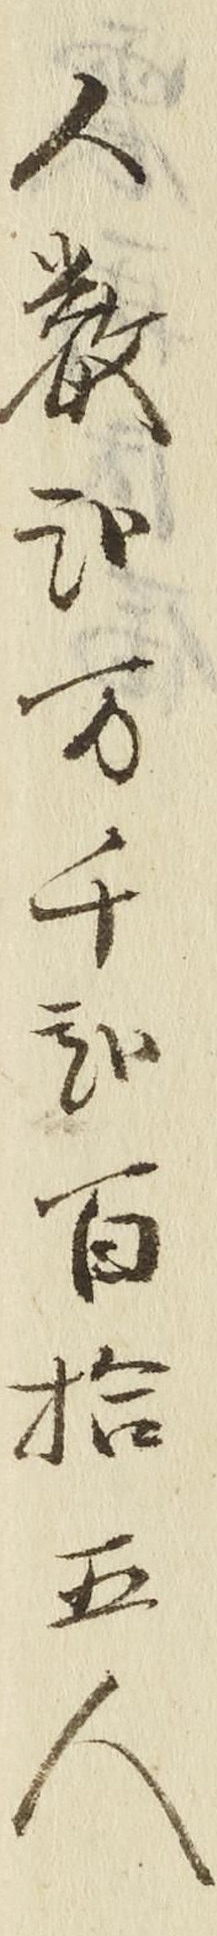人数弐万千弐百拾五人
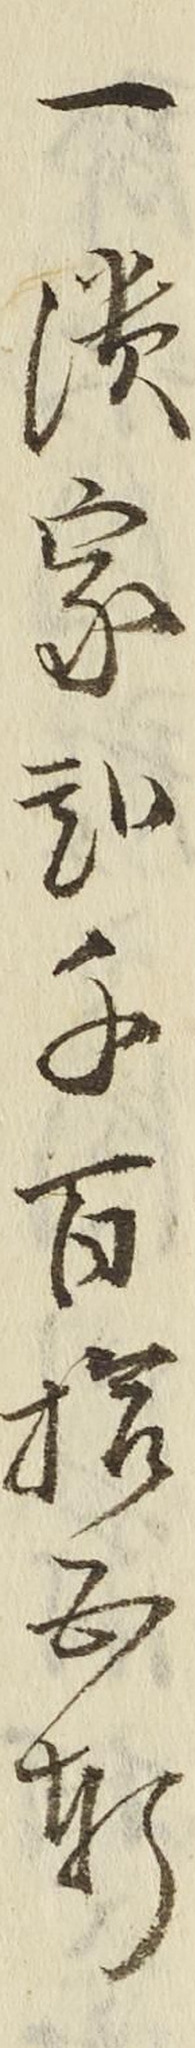一潰家弐千百拾五軒
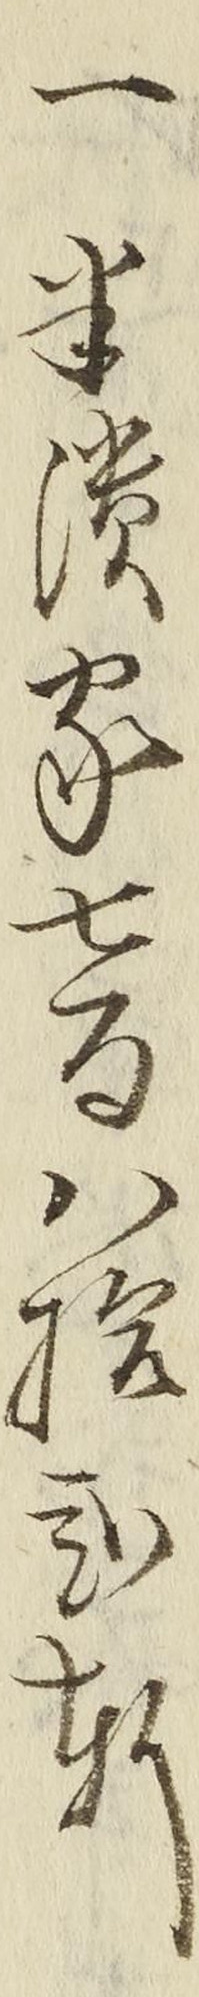一半潰家七百八拾弐軒
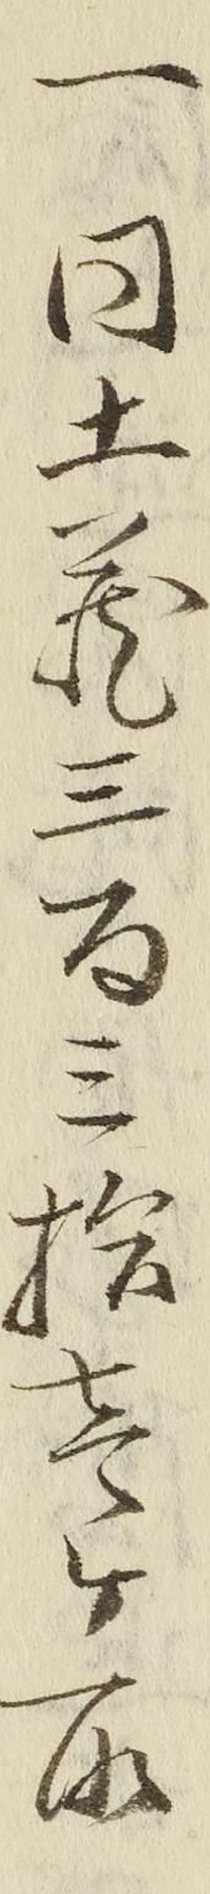一同土蔵三百三拾壱ヶ所
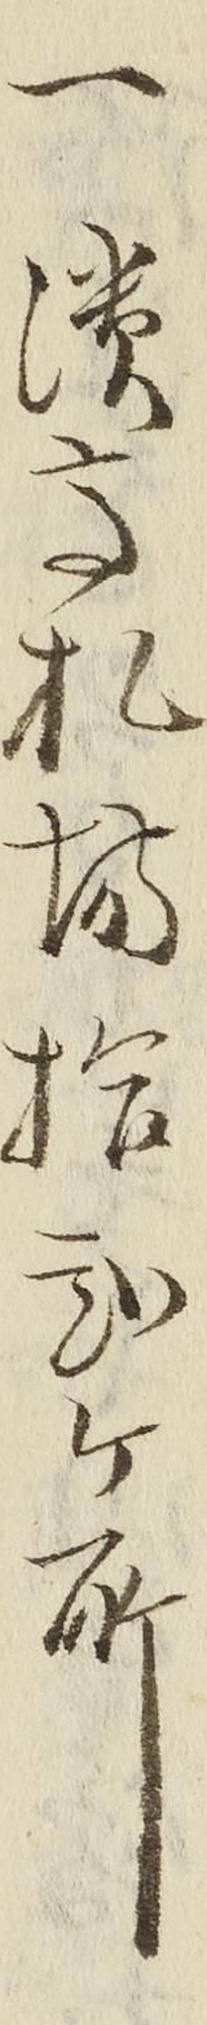一潰高札場拾弐ヶ所
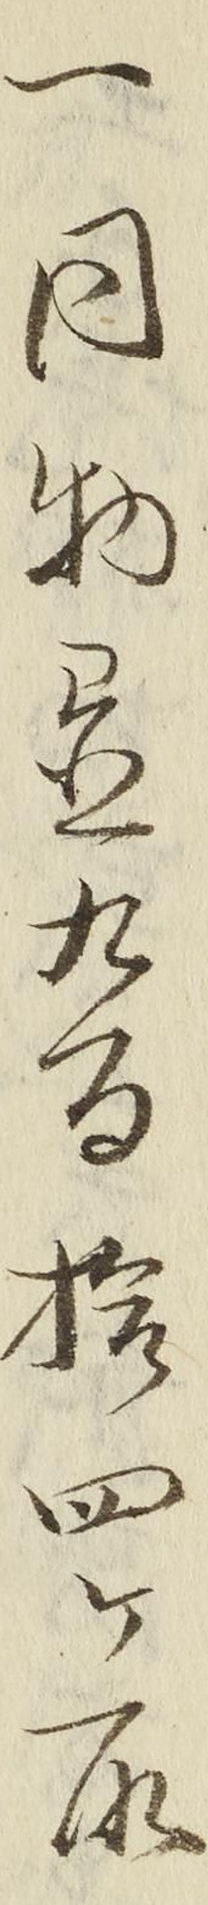一同物置九百拾四ヶ所
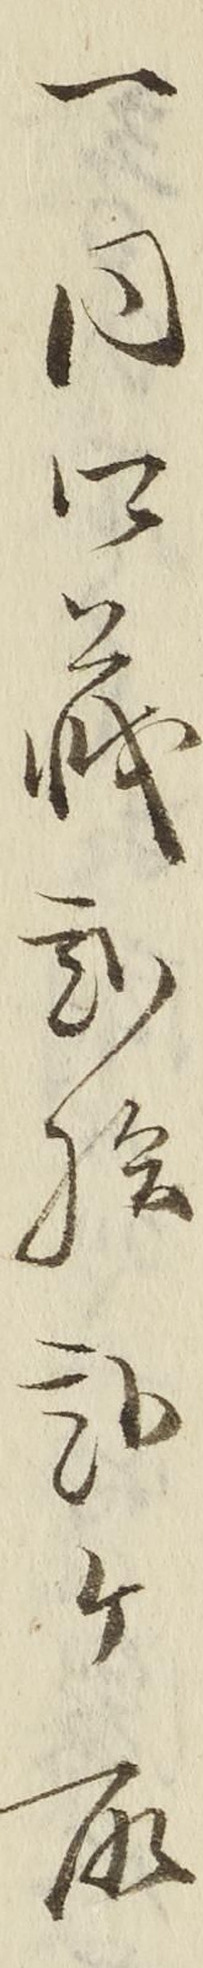一同郷蔵弐拾弐ヶ所
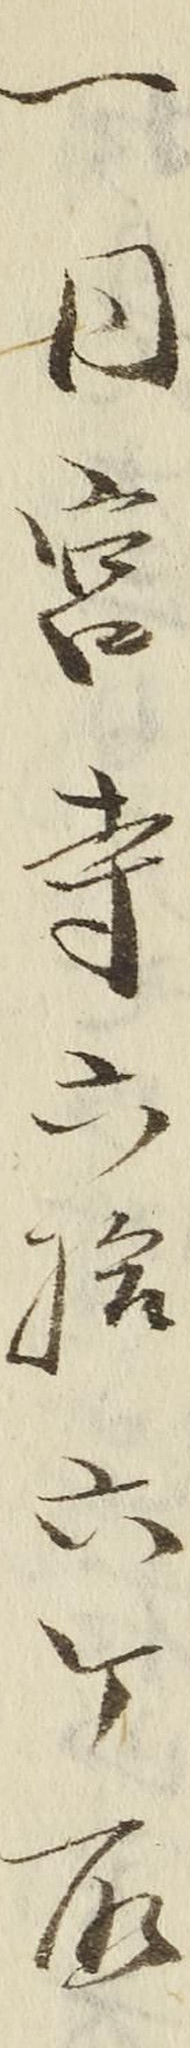一同宮寺六拾六ヶ所
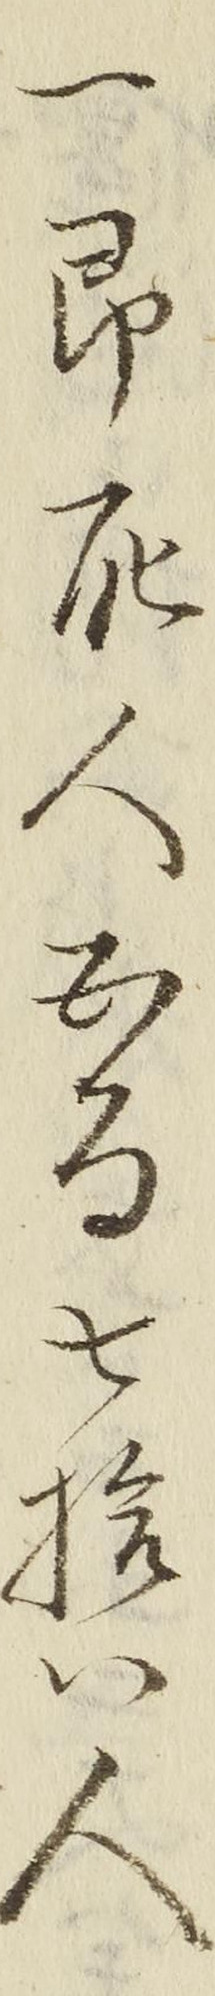一即死人五百七拾八人
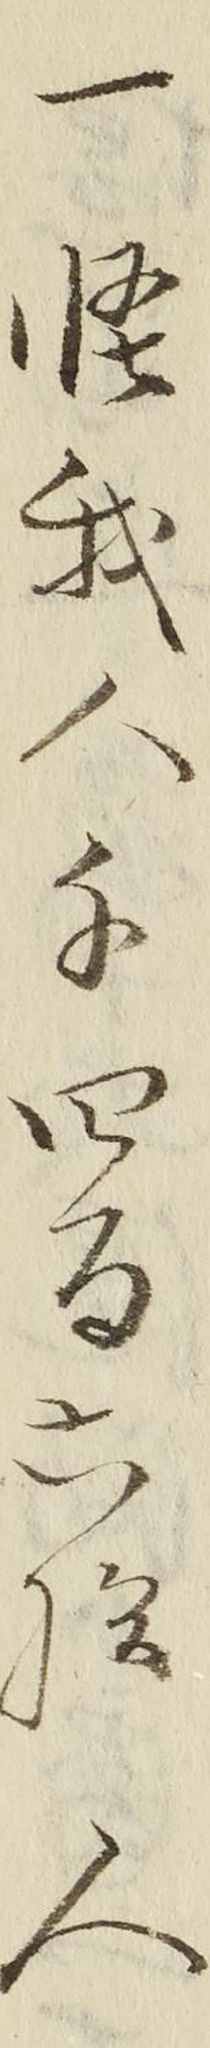一怪我人千四百六拾人
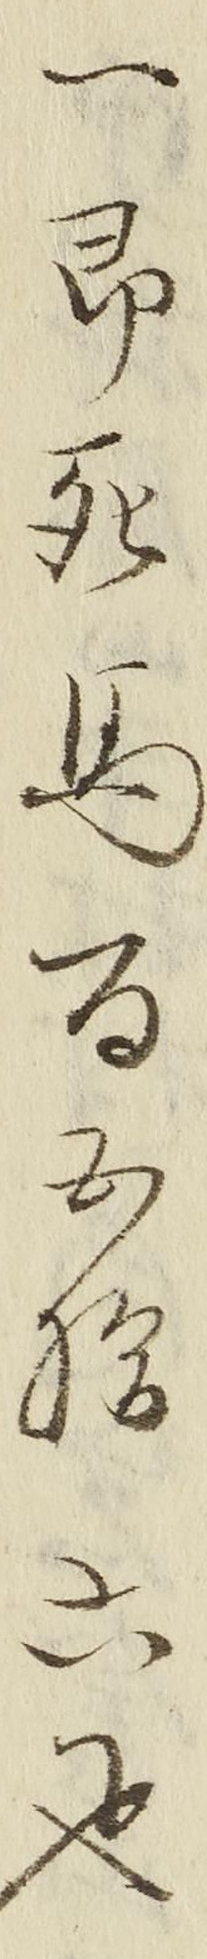一即死馬百五拾六疋
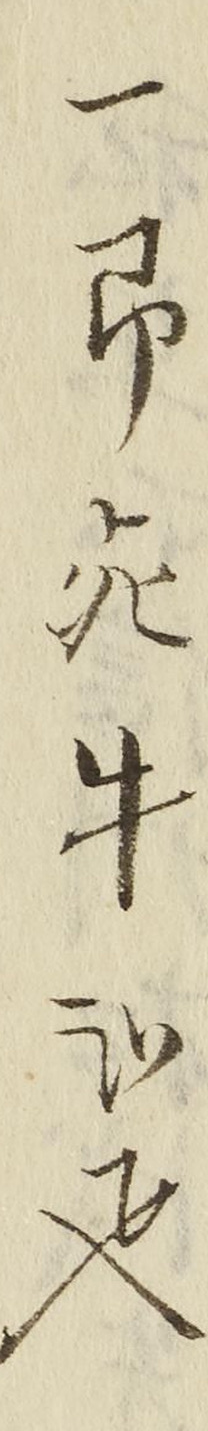一即死牛弐疋

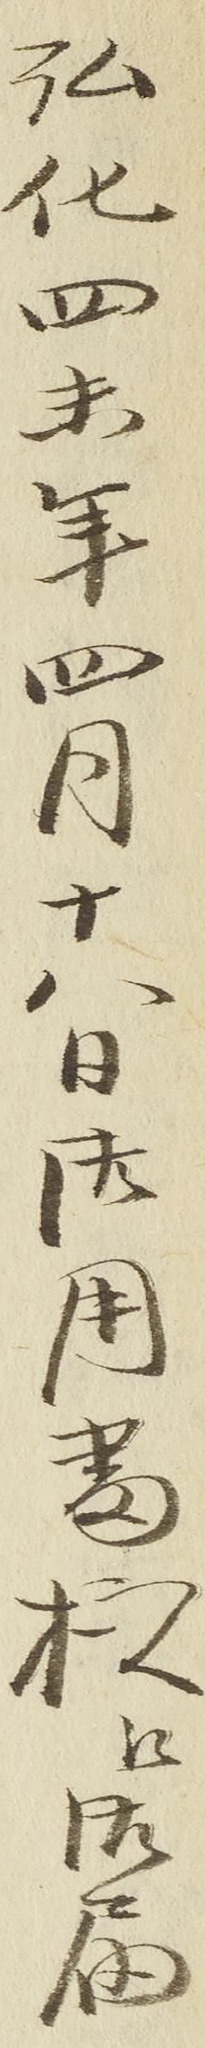弘化四未年四月十八日御用番様江御届
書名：信濃國大地震記　乾
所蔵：東京大学地震研究所図書室 Earthquake Research Institute Library, The University of Tokyo, JAPAN
